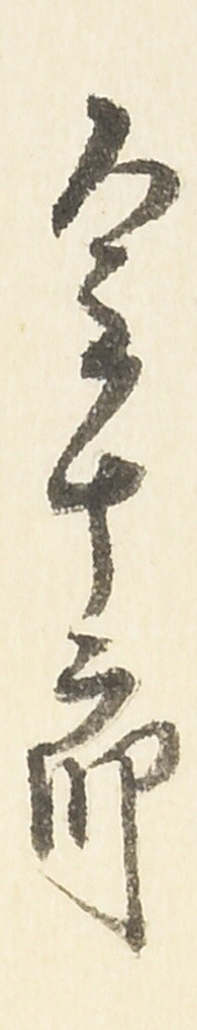金十郎
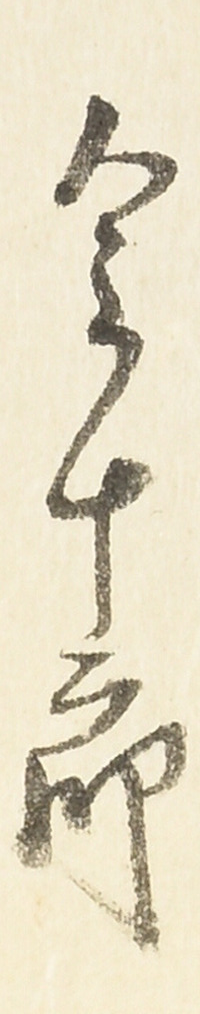金十郎
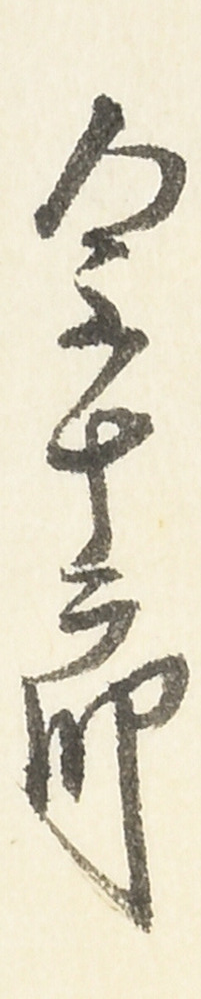金十郎
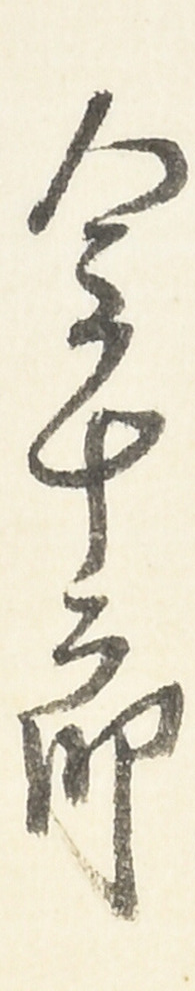金十郎
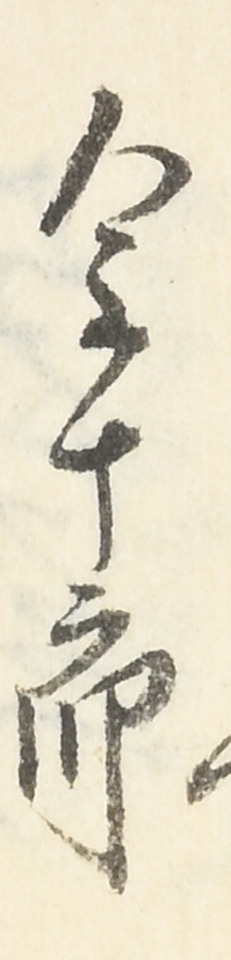金十郎

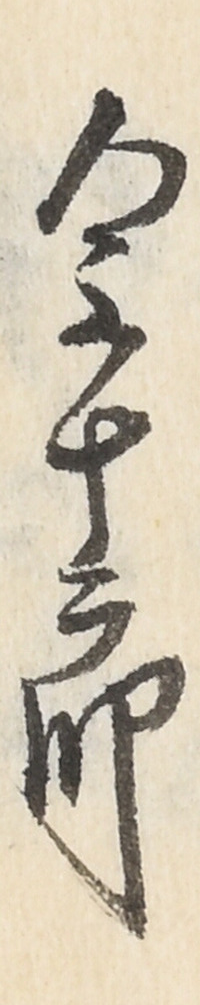金十郎
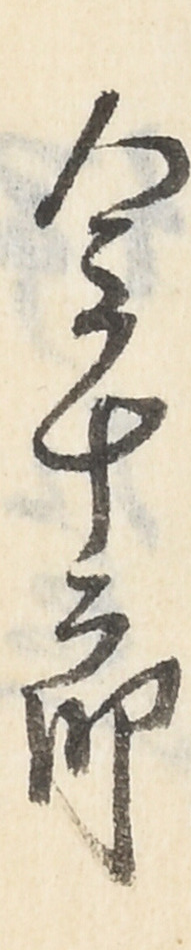金十郎
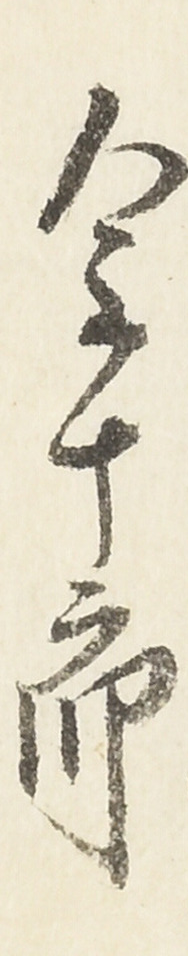金十郎
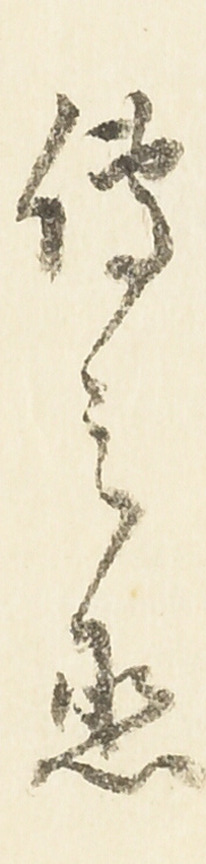伝之丞
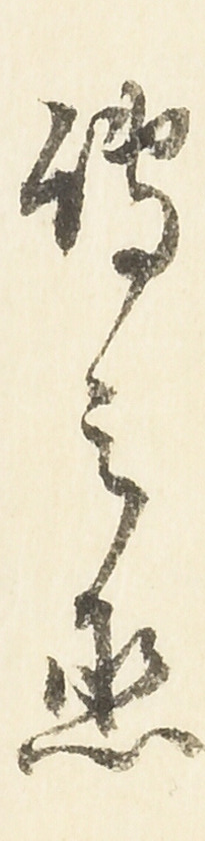伝之丞
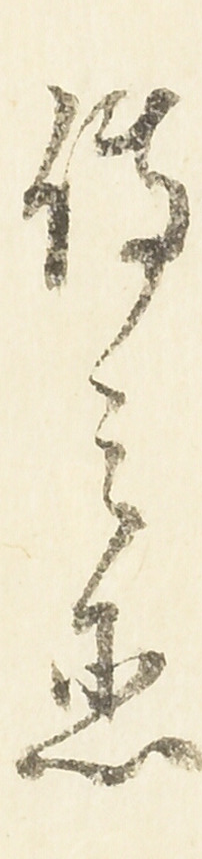伝之丞
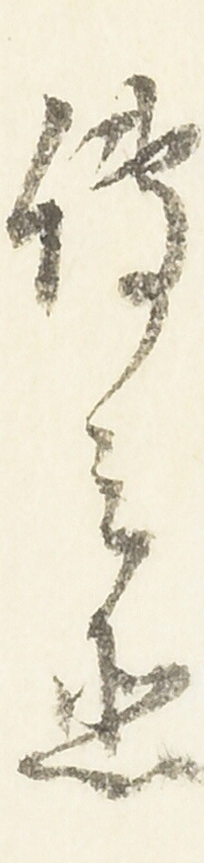伝之丞

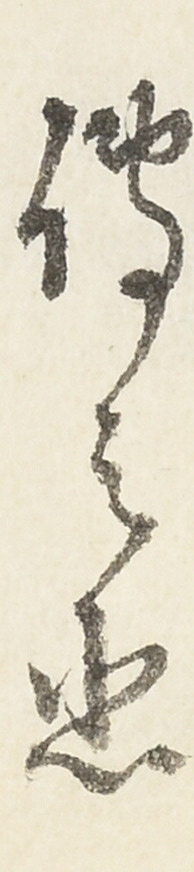伝之丞
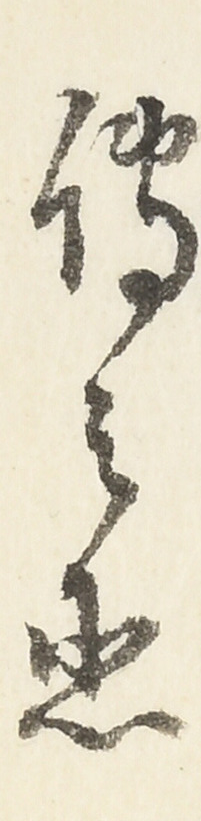伝之丞
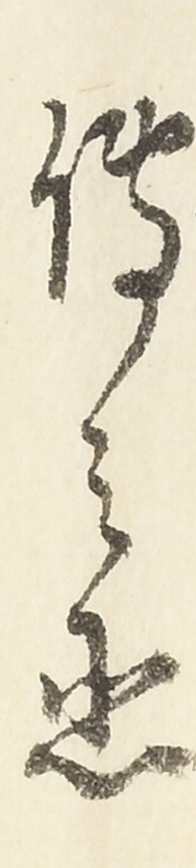伝之丞
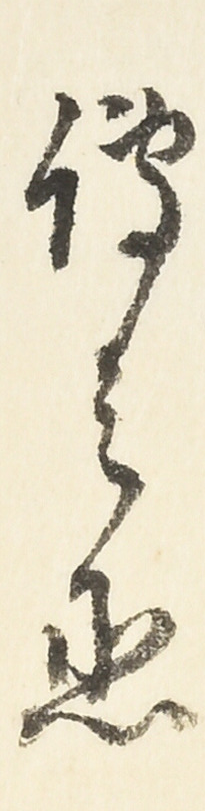伝之丞
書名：鉾持町丁代勤役年歴順控
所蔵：伊那市立高遠町図書館・合同会社AMANE
